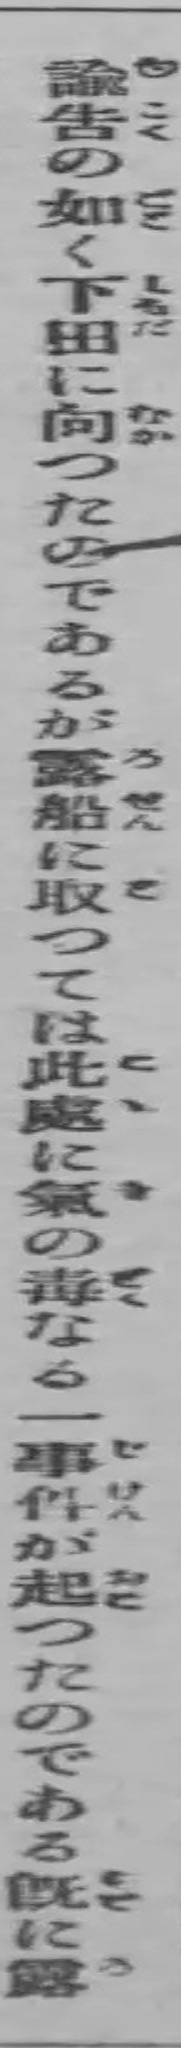諭告の如く下田に向つたのであるが露船に取つては此処に気の毒なる一事件が起つたのである既に露
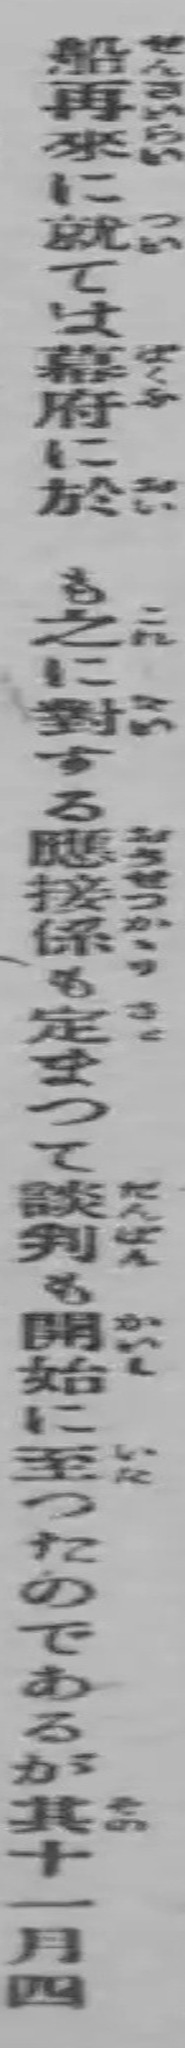船再来に就ては幕府に於ても之に対する応接係も定まつて談判も開始に至つたのであるが其十一月四
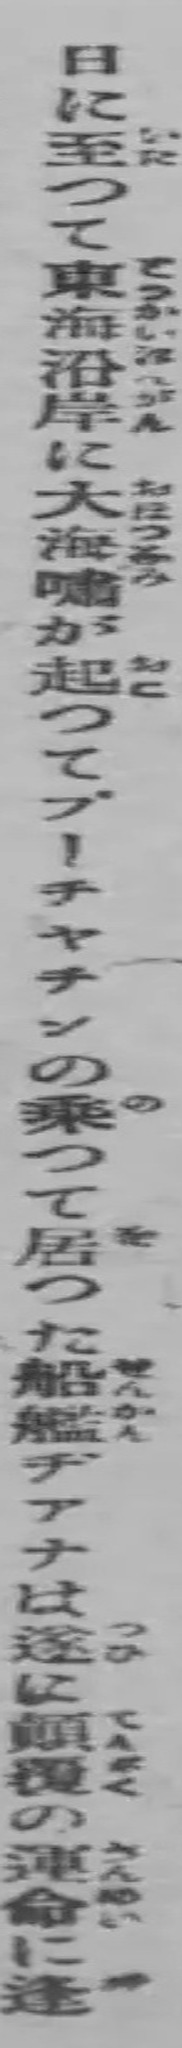日に至つて東海沿岸に大津嘯が起つてプーチヤチンの乗つて居つた船艦ヂアナは遂に顚覆の運命に逢
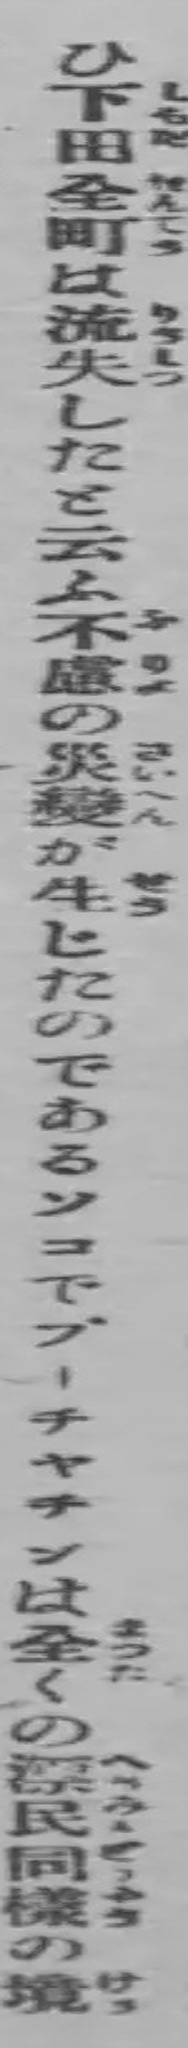ひ下田全町は流失したと云ふ不慮の災変が生じたのであるソコでプーチヤチンは全くの漂民同様の境
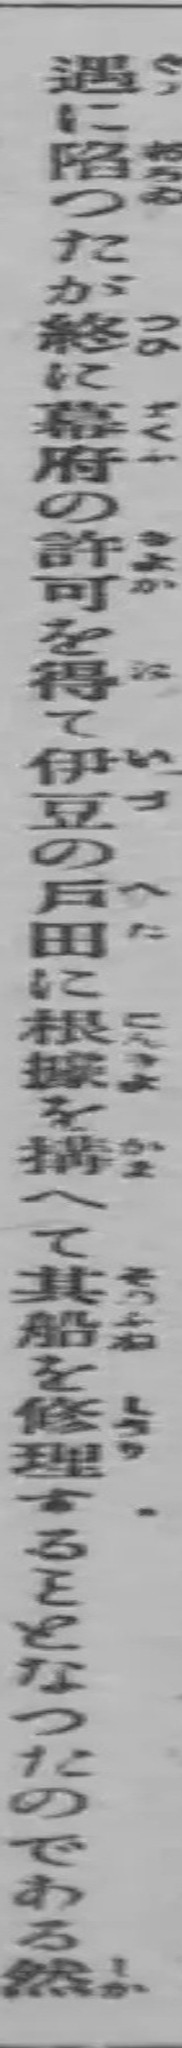遇に陥つたが終に幕府の許可を得て伊豆の戸田に根拠を構へて其船を修理することとなつたのである然
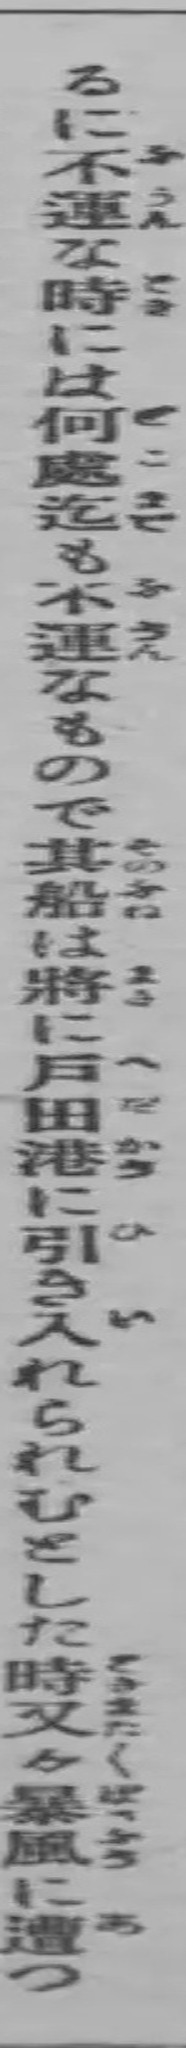るに不運な時には何処迄も不運なもので其船は将に戸田港に引き入れらむとした時又々暴風に遭つ
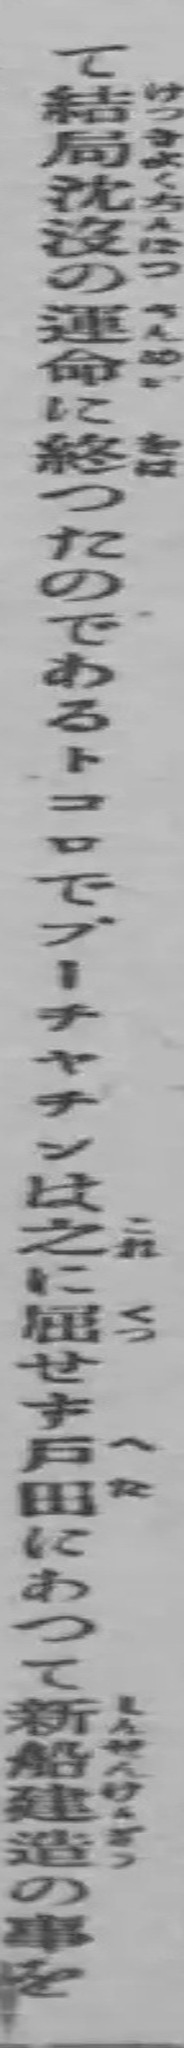て結局沈没の運命に終つたのであるトコロでプーチヤチンは之に屈せず戸田にあつて新船建造の事を
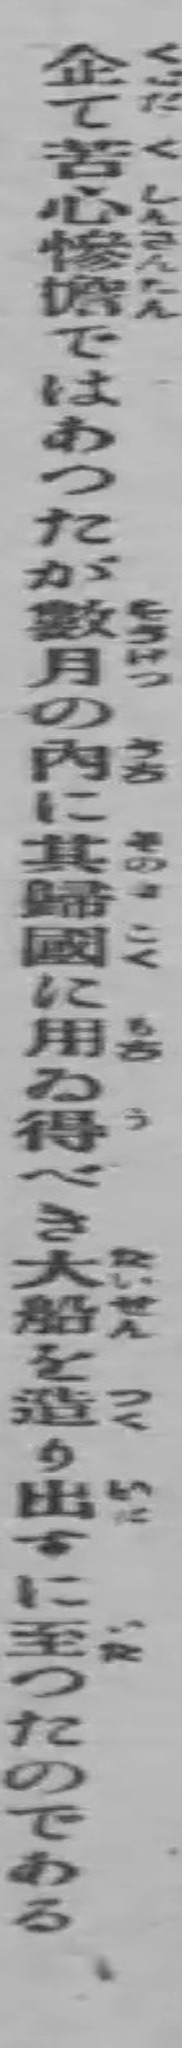企て苦心惨憺ではあつたが数月の内に其帰国に用ゐ得べき大船を造り出すに至つたのである
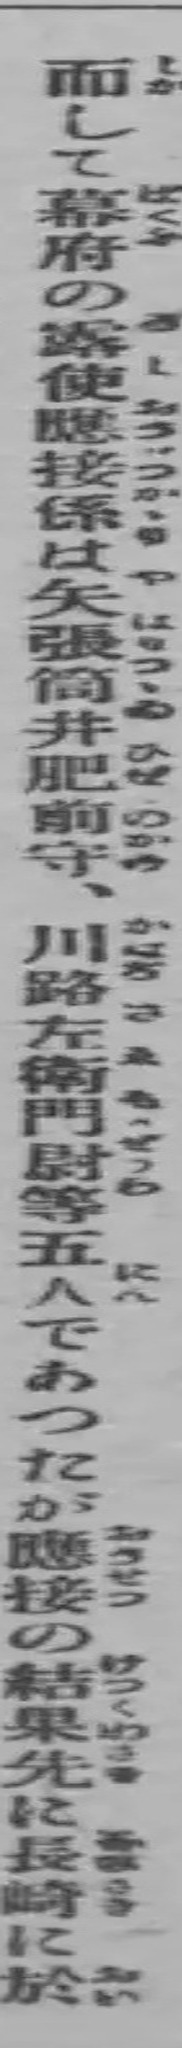而して幕府の露使応接係は矢張筒井肥前守、川路左衛門尉等五人であつたが応接の結果先に長崎に於
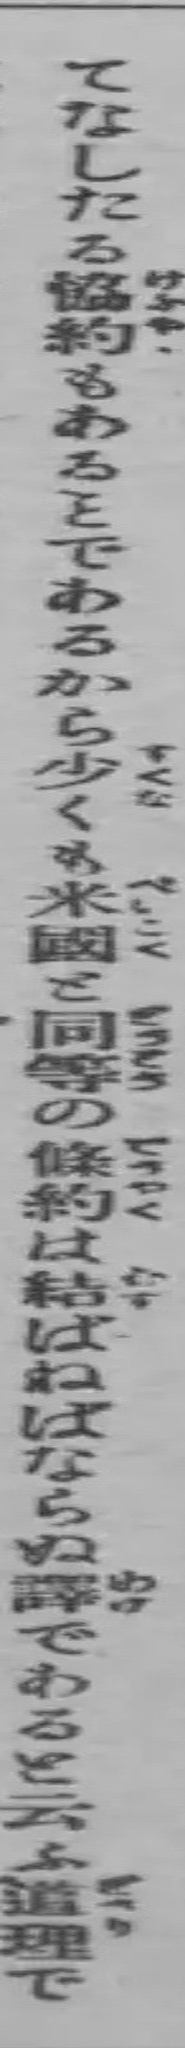てなしたる協約もあることであるから少くも米国と同等の条約は結ばねばならぬ訳であると云ふ道理で
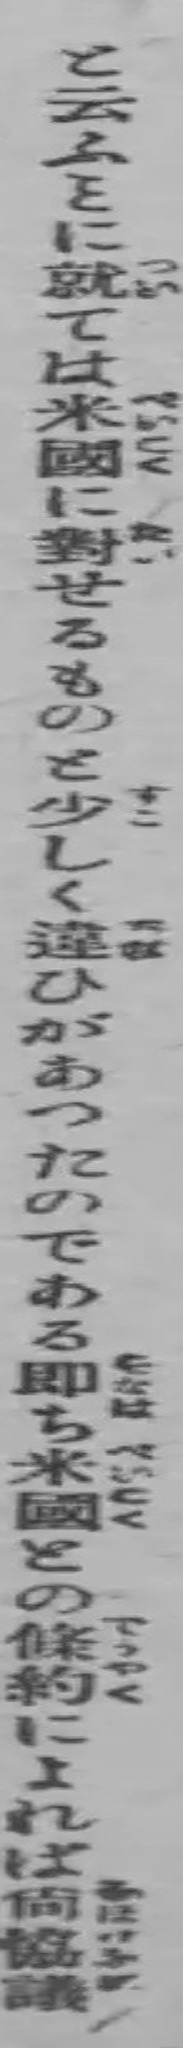と云ふことに就ては米国に対せるものと少しく違ひがあつたのである即ち米国との条約によれば尚協議
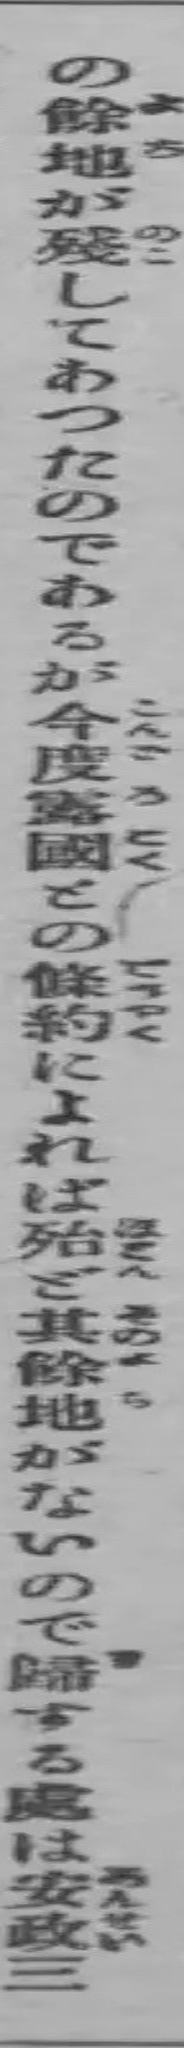の余地が残してあつたのであるが今度露国との条約によれば殆ど其余地がないので帰する処は安政三
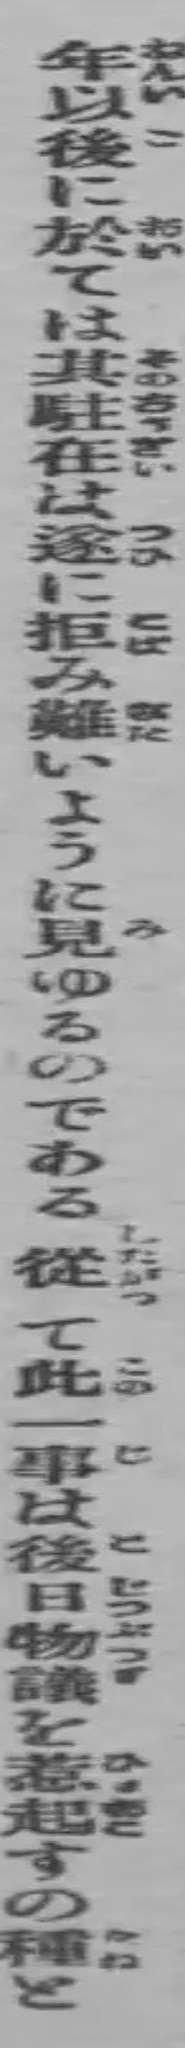年以後に於ては其駐在は遂に拒み難いように見ゆるのである従て此一事は後日物議を惹起すの種と
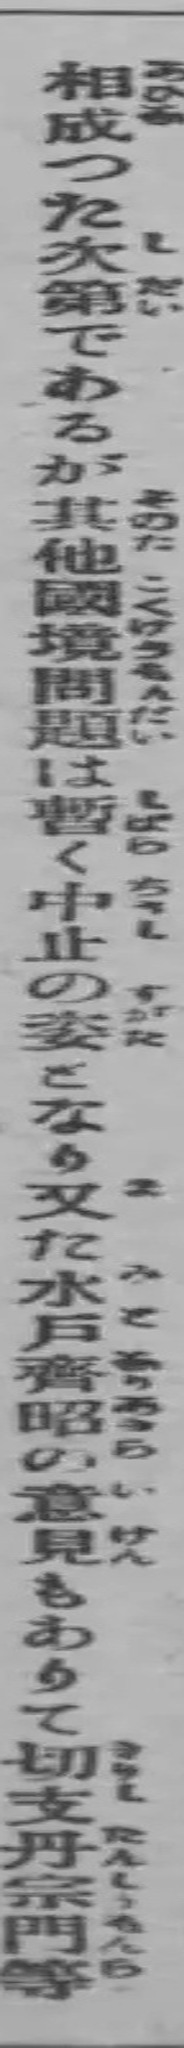相成つた次第であるが其他国境問題は暫く中止の姿となり又た水戸斉昭の意見もありて切支丹宗門等
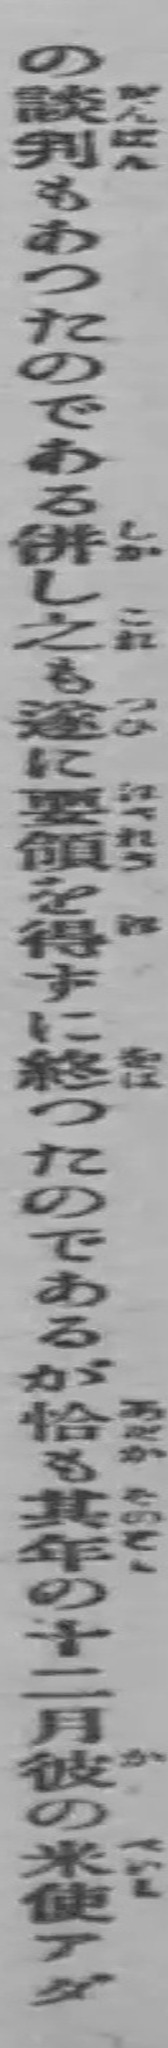の談判もあつたのである併し之も遂に要領を得ずに終つたのであるが恰も其年の十二月彼の米使アダ
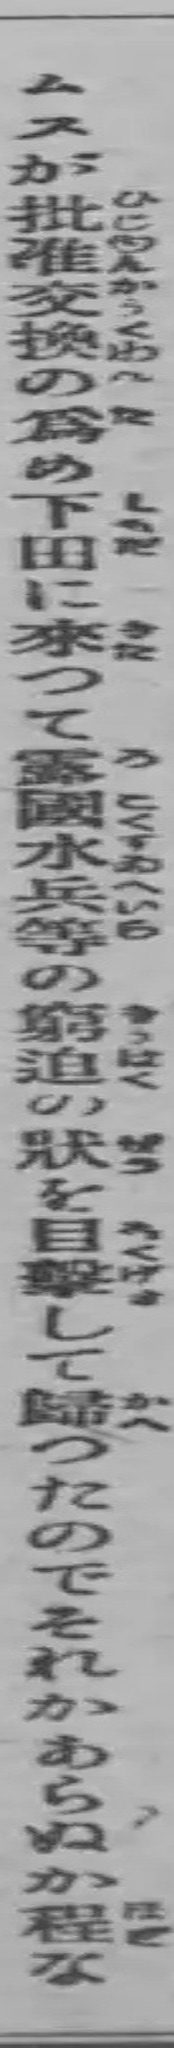ムスが批准交換の為め下田に来つて露国水兵等の窮迫の状を目撃して帰つたのでそれかあらぬか程な
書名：豊橋市史談
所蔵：国立国会図書館 National Diet Library, JAPAN
